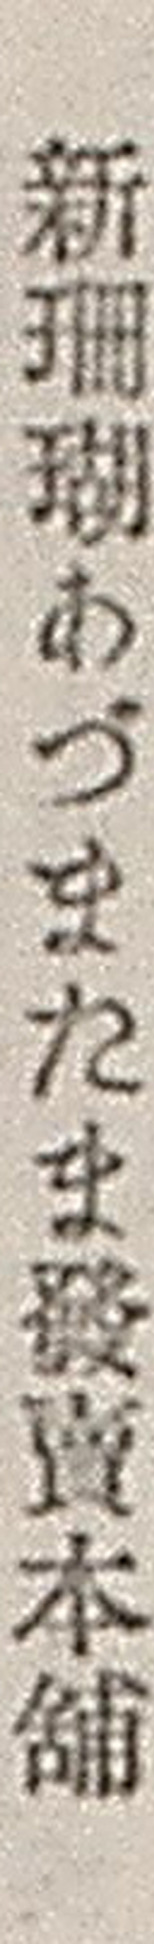新珊瑚あづまたま発売本舗
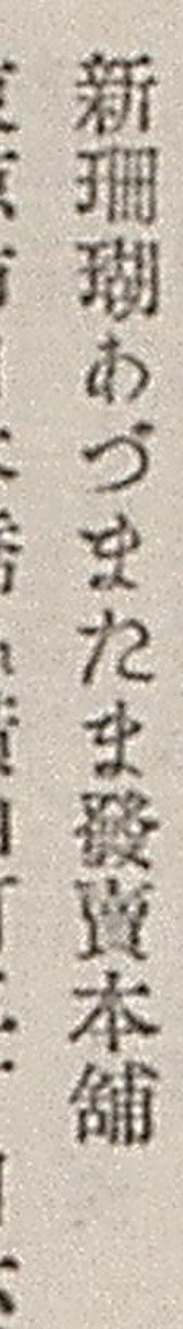新珊瑚あづまたま発売本舗
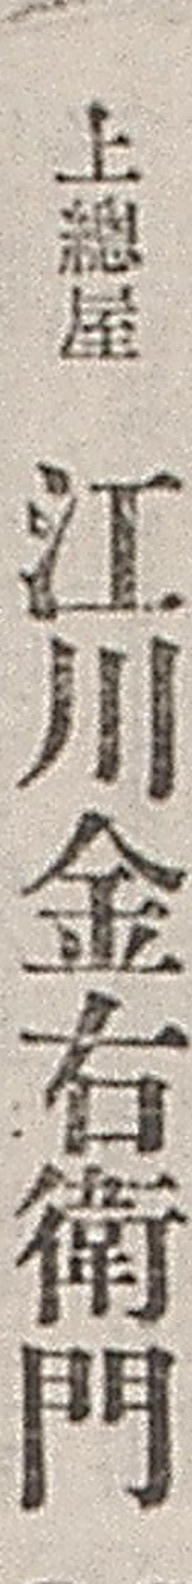上総屋江川金右衛門
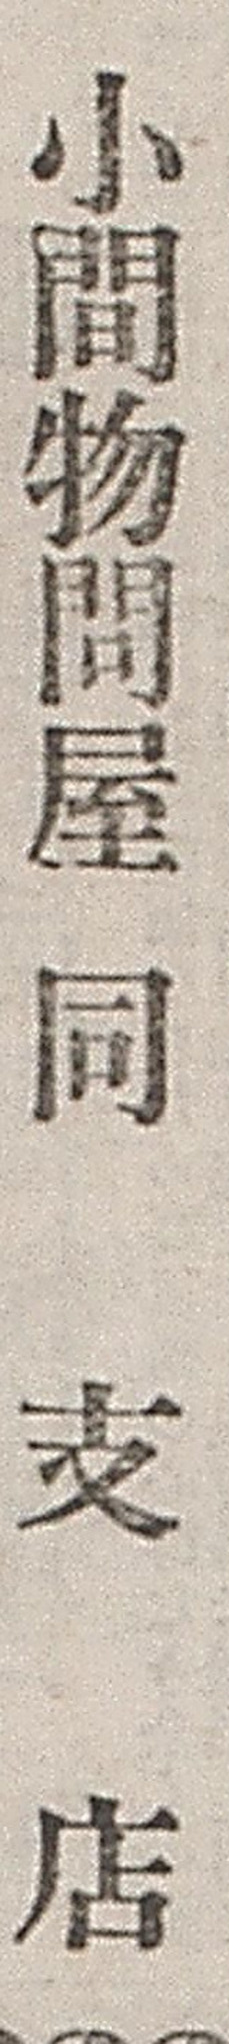小間物問屋同支店
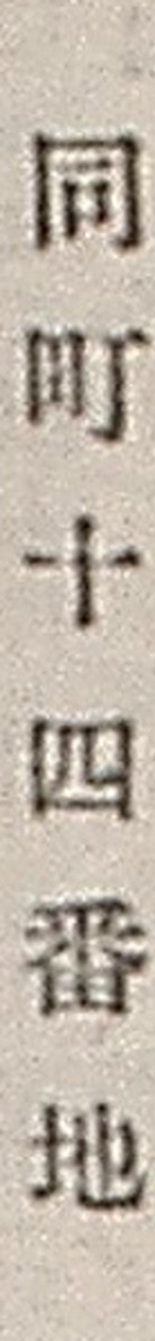同町十四番地

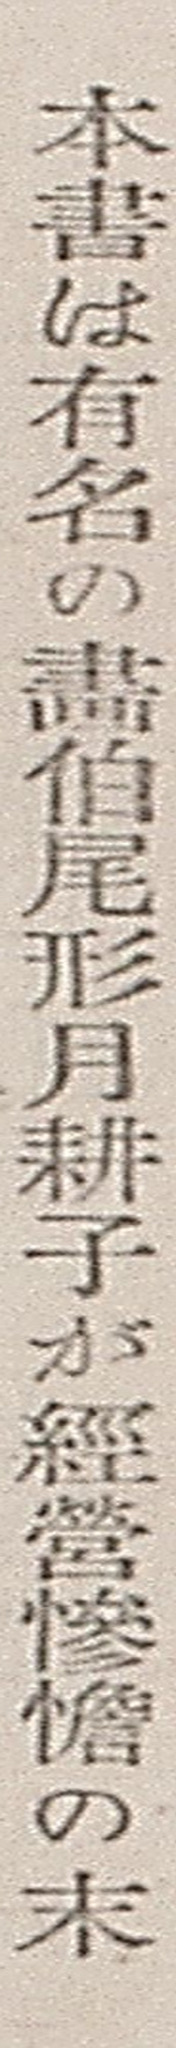本書は有名の画伯尾形月耕子が経営惨憺の末
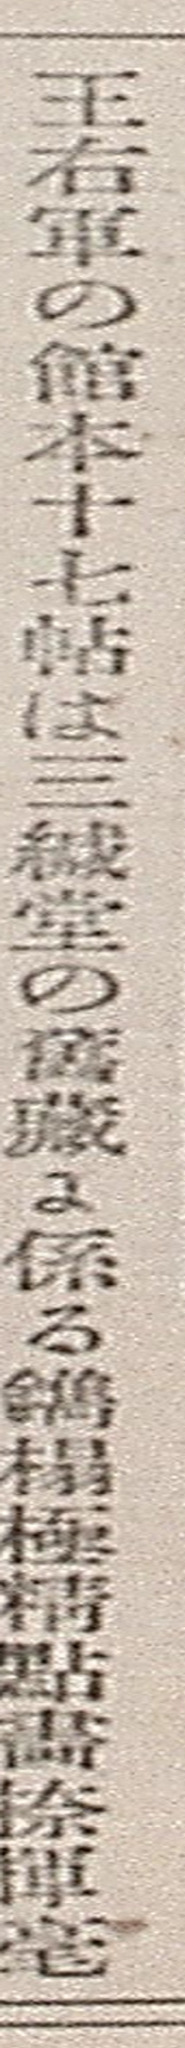王右軍の館本十七帖は三緘堂の旧蔵に係る鐫榻極精点画捺揮毫
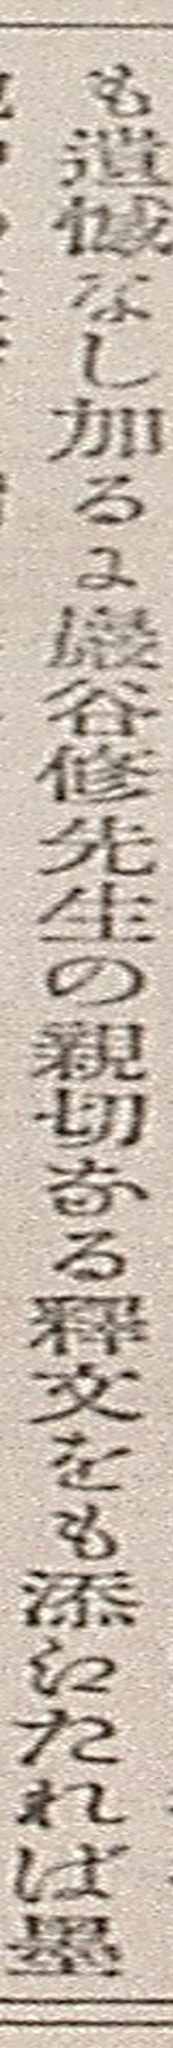も遺憾なし加るにｇ巌谷修先生の親切なる釈文をも添えたれば墨
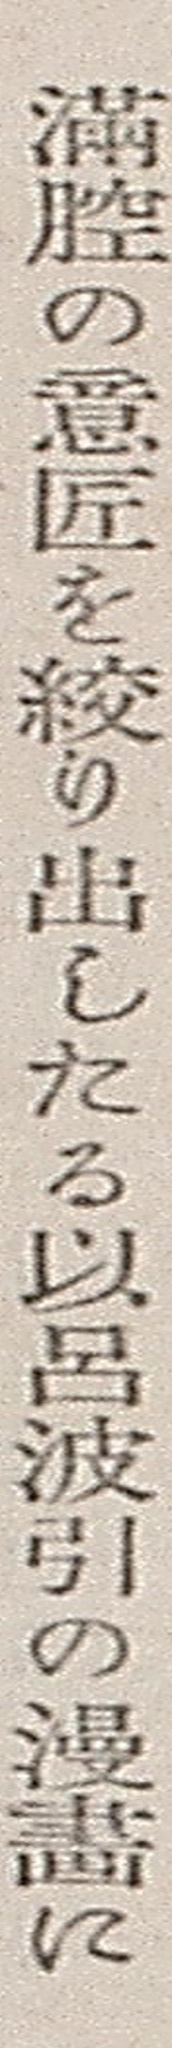満腔の意匠を絞り出したる以呂波引の漫画に
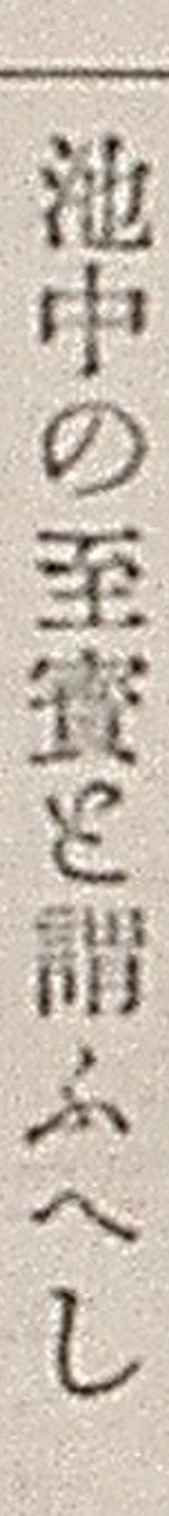池中の至宝と謂ふへし
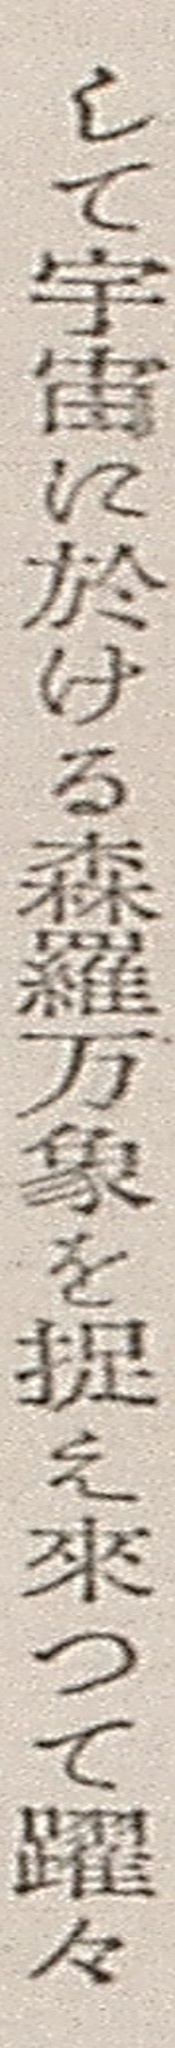して宇宙に於ける森羅万象を捉え来つて躍々
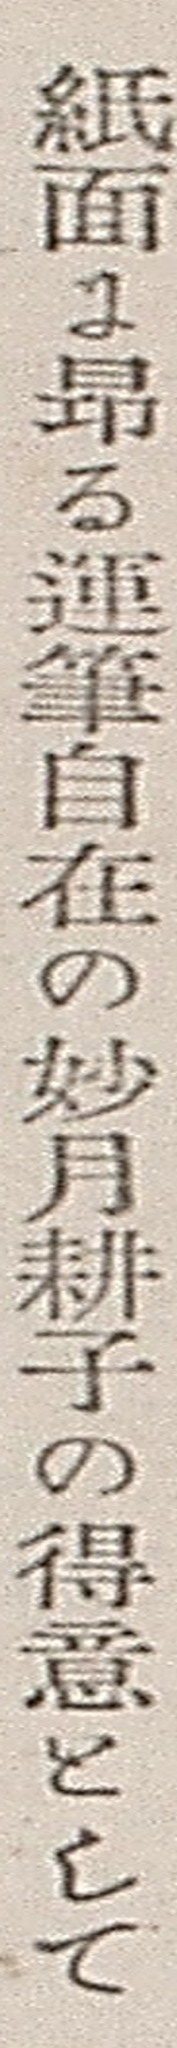紙面に昂る運筆自在の妙月耕子の得意として
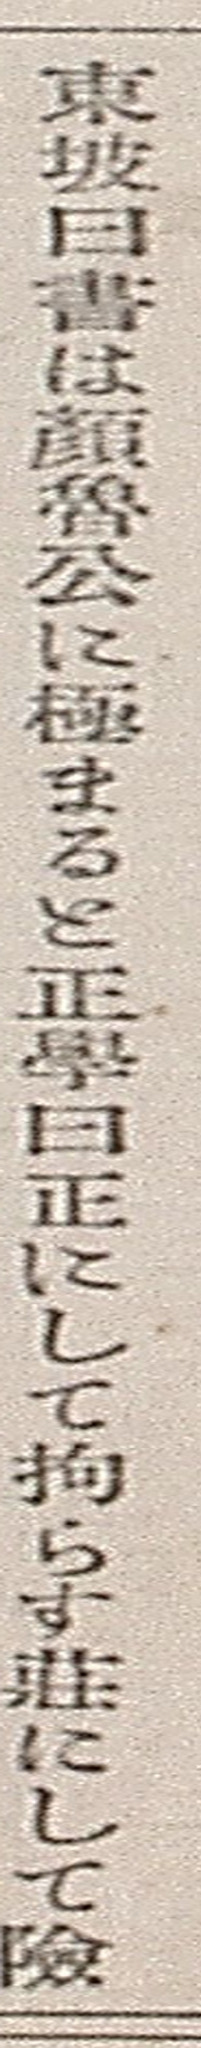東坡曰書は顔魯公に極まると正学曰正にして拘らす荘にして険
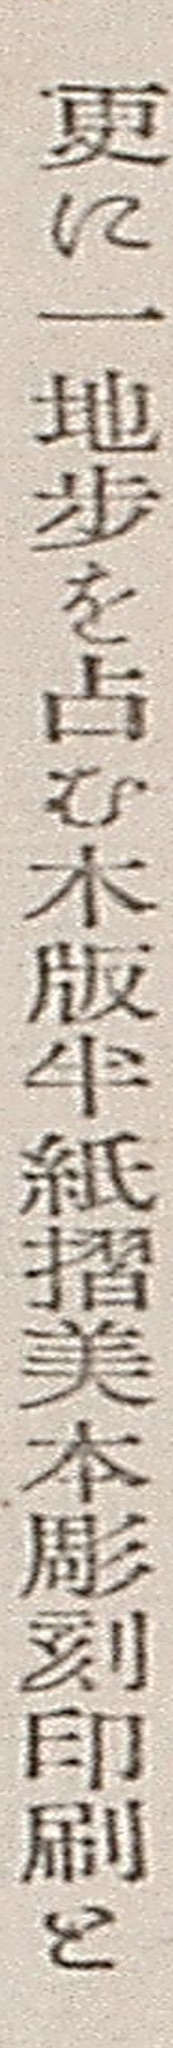更に一地歩を占む木版半紙摺美本彫刻印刷と
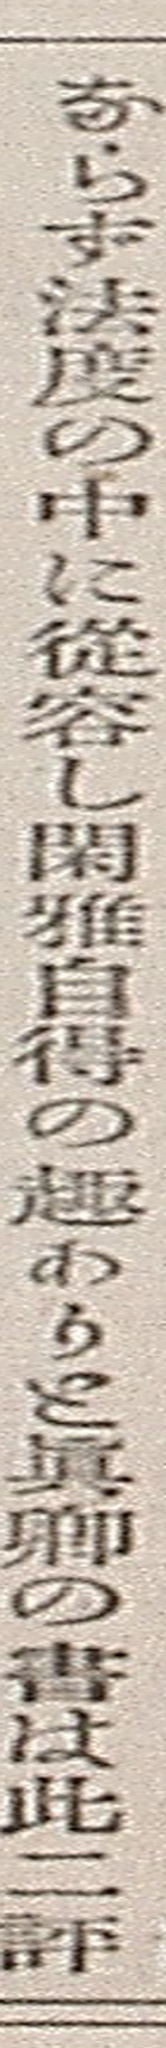ならす法度の中に従容し閑雅自得の趣ありと真卿の書は此二評
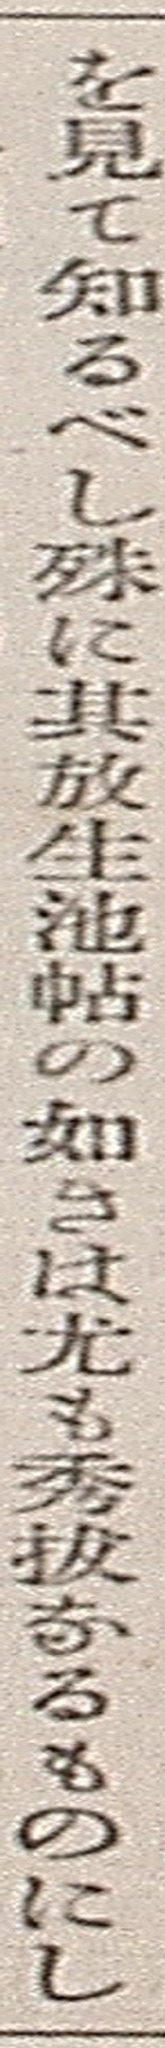を見て知るべし殊に其放生池帖の如きは尤も秀抜なるものにし
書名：風俗畫報臨時増刊第百二十四號　洪水地震被害録（上）
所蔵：東京大学地震研究所図書室 Earthquake Research Institute Library, The University of Tokyo, JAPAN
